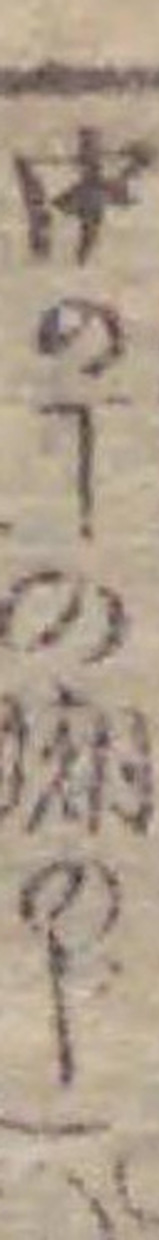中の丁の潮のじ
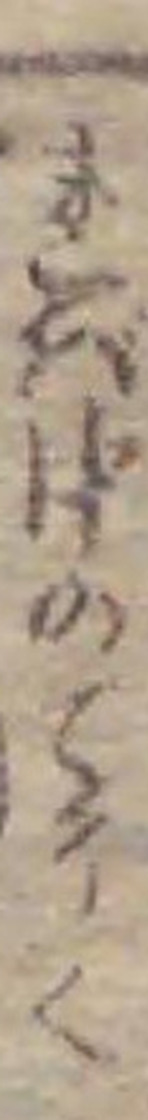れば中のてう也
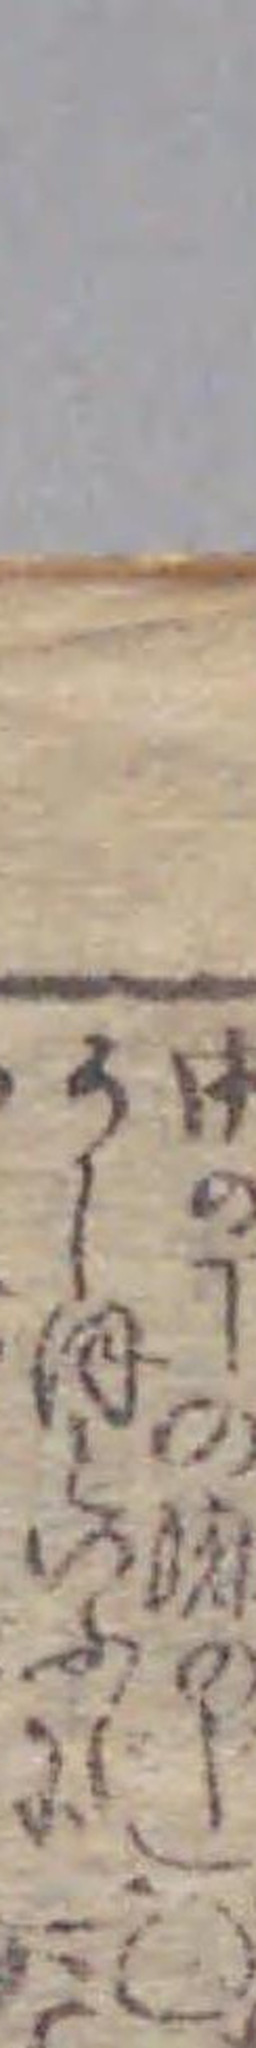うしほといふじに
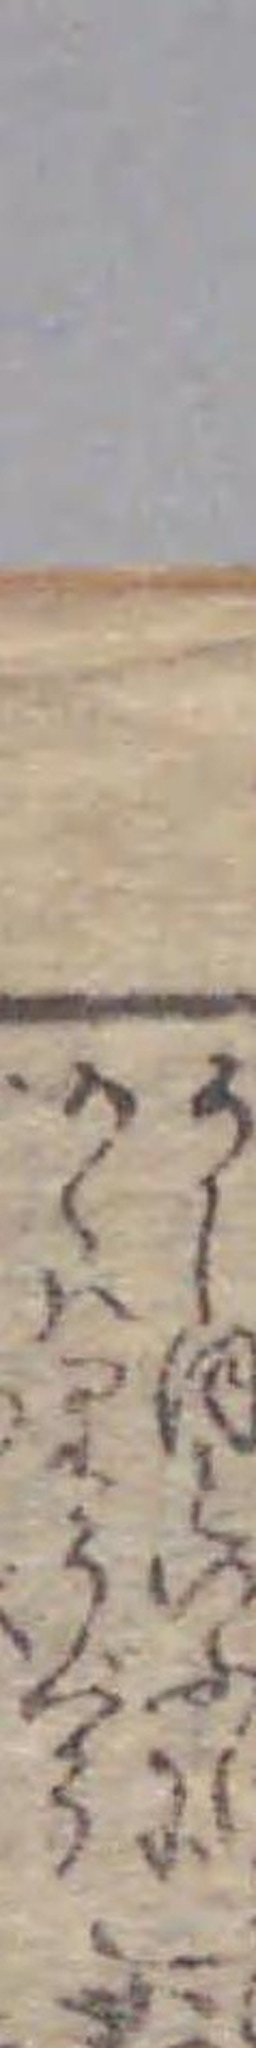かくはりうぐう
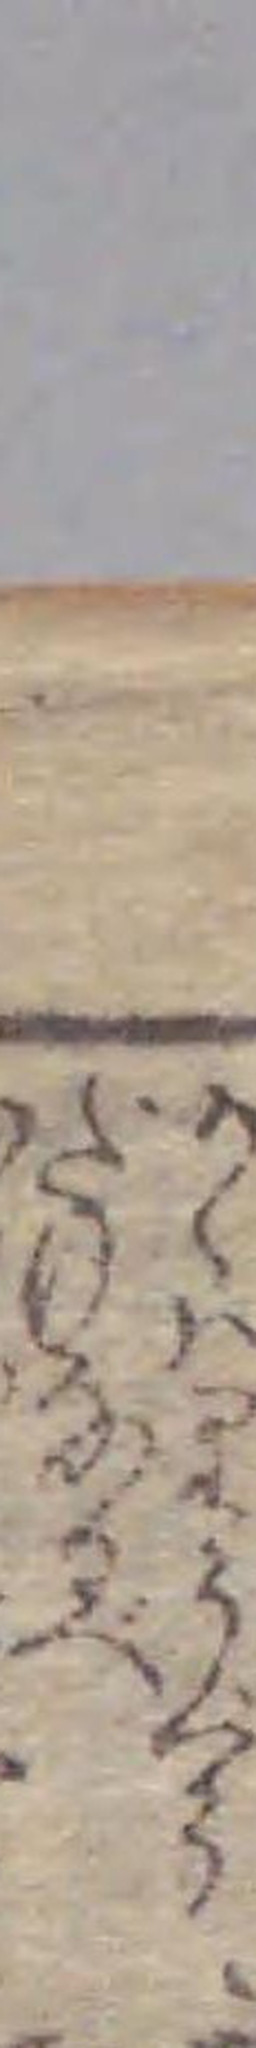だけなるべ
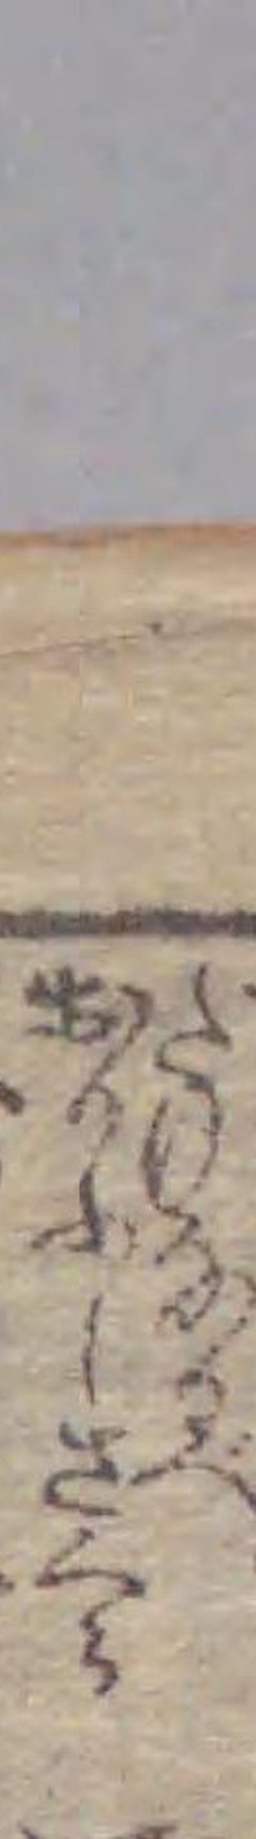おりふしさくら
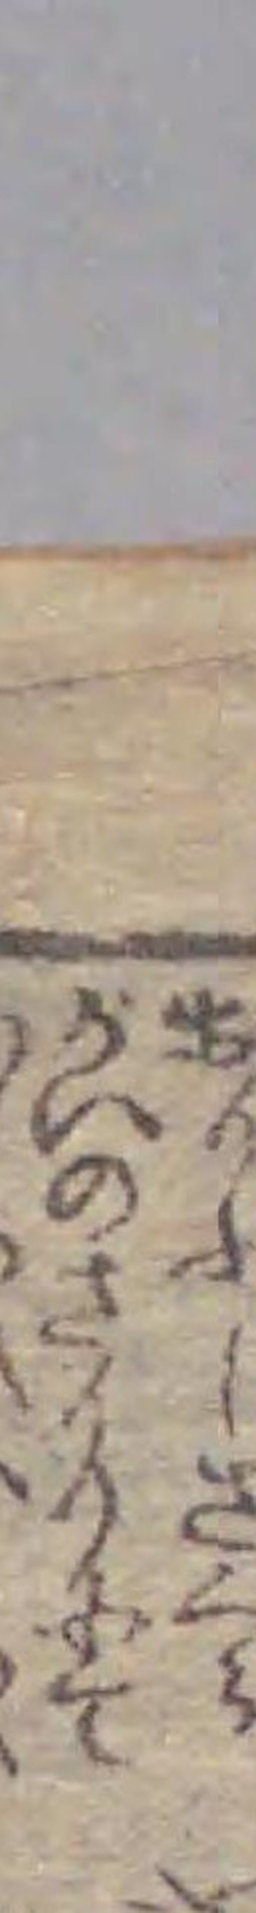がいのさかりにて
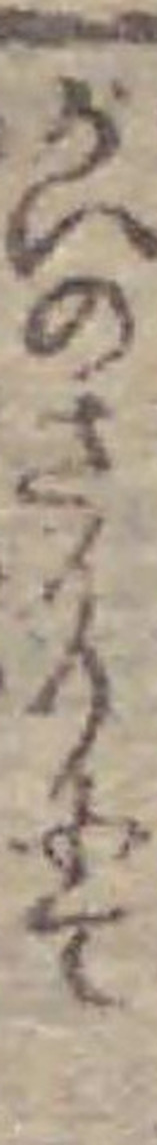がいのさかりにて
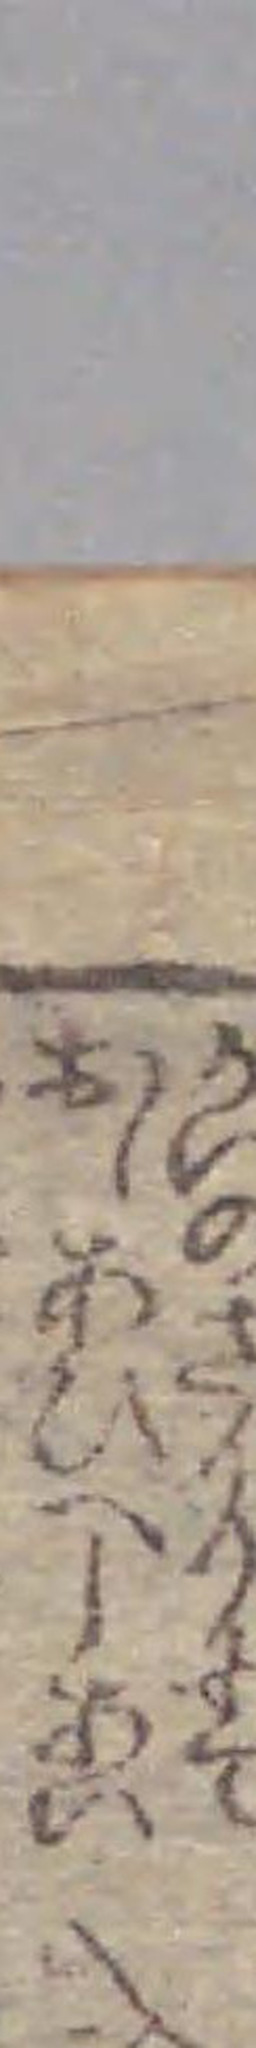おしあひへしあい
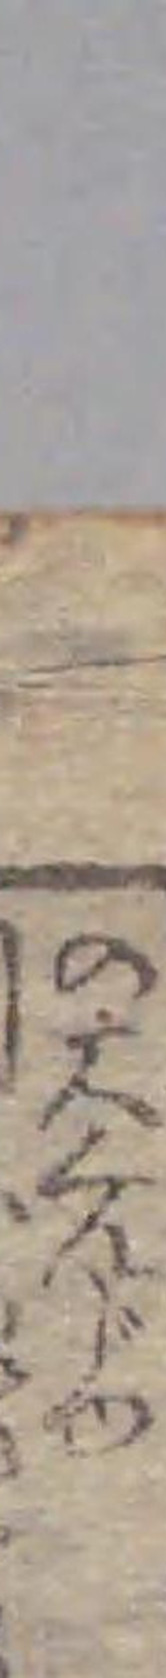の大くんじゆ
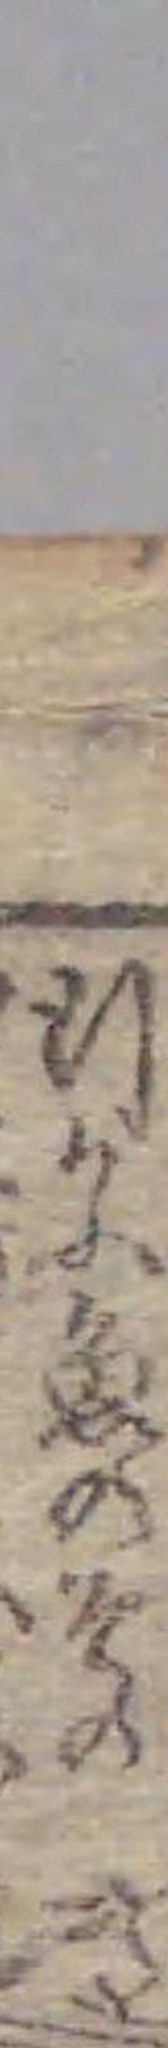行かふ魚のその
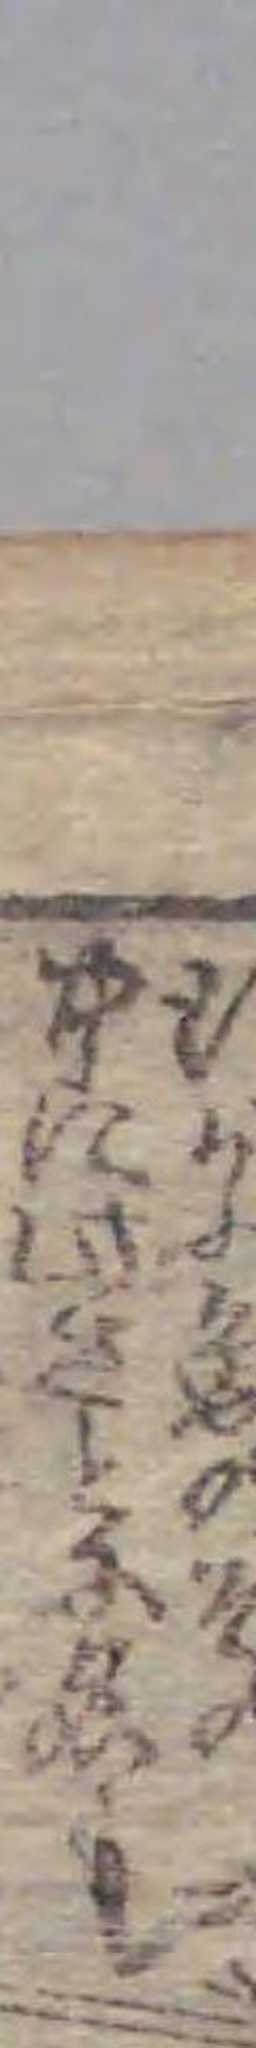中に此さとに名も
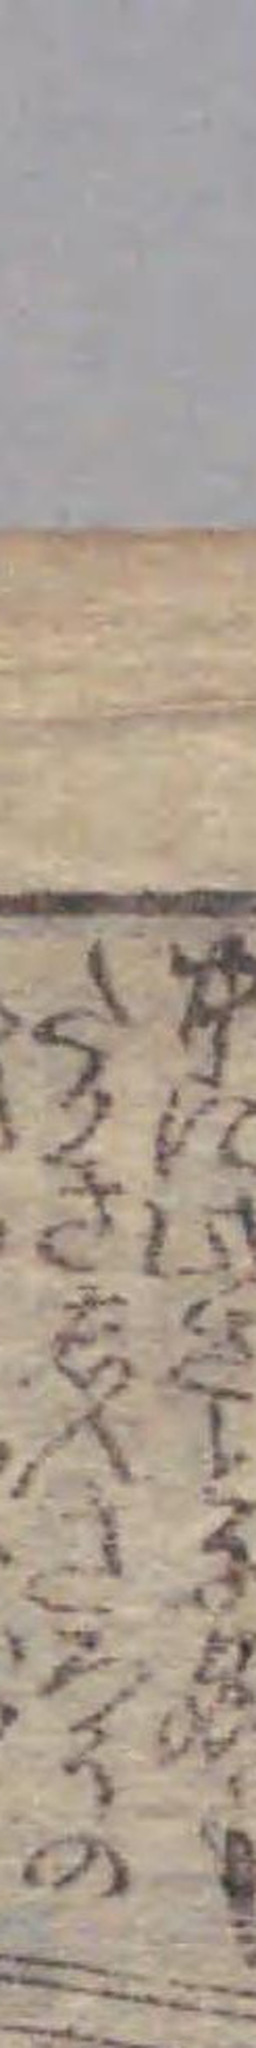たかきしんきろうの
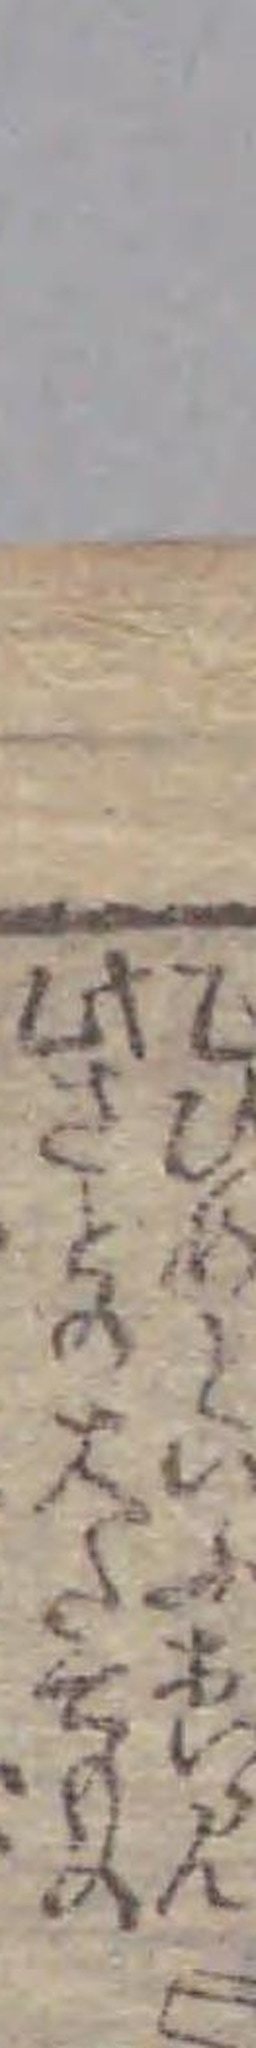此さとの大たてもの
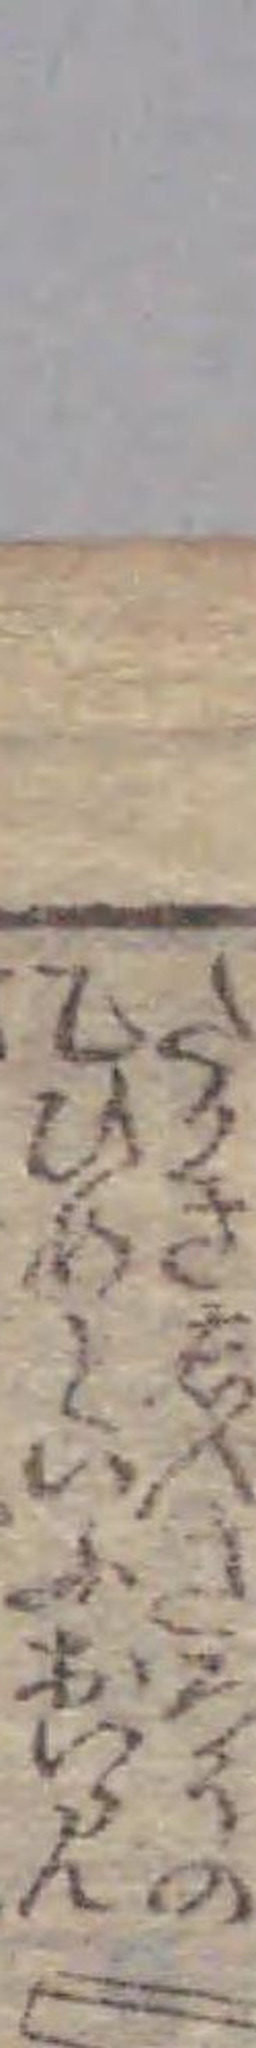乙ひめといふおいらん
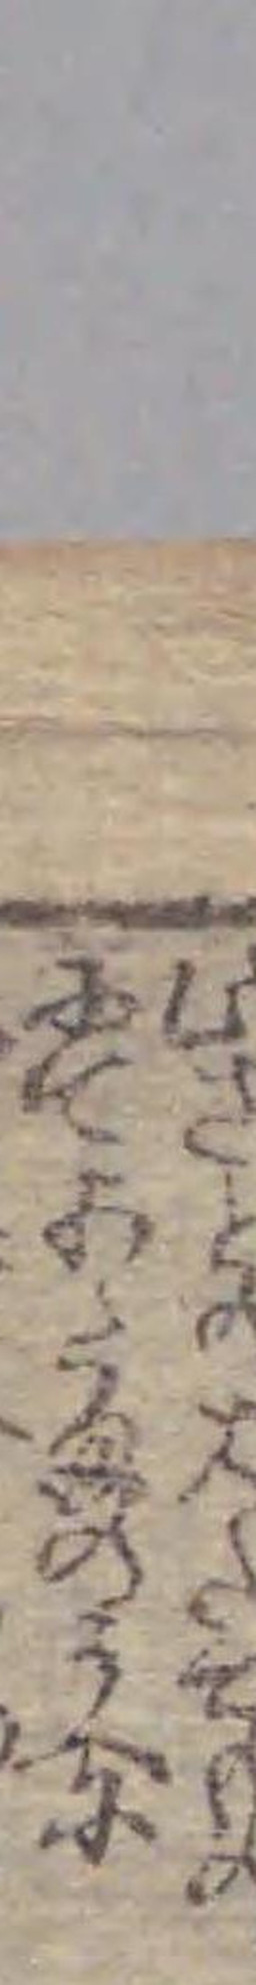にてあたまのうへに
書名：竜宮苦界玉手箱 : 3巻
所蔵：国立国会図書館 National Diet Library, JAPAN
